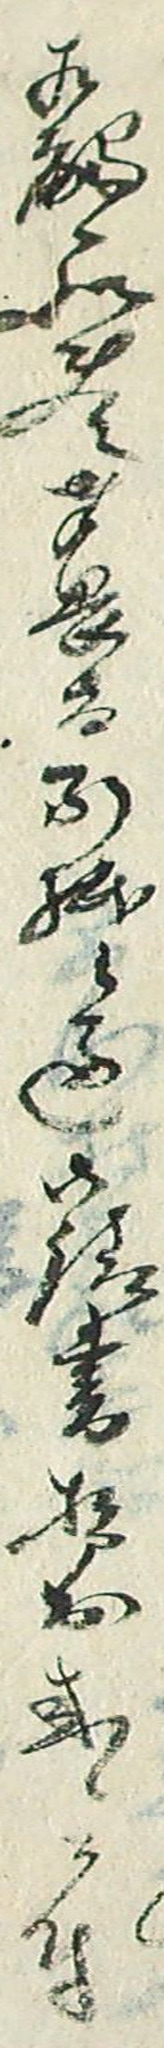相触候処夫々奉畏旨別紙之通御請書指出来候に付
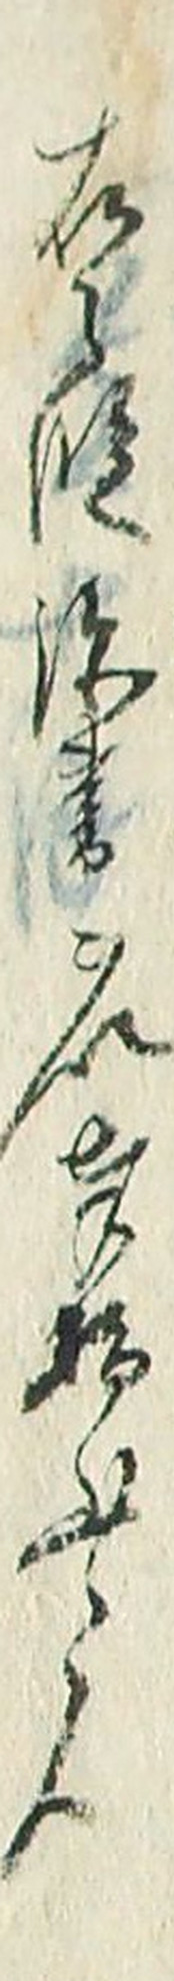右之段添書を以奉指上候

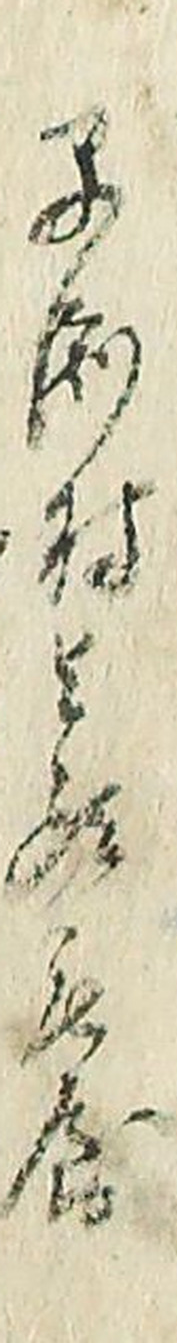早渕村与頭庄屋
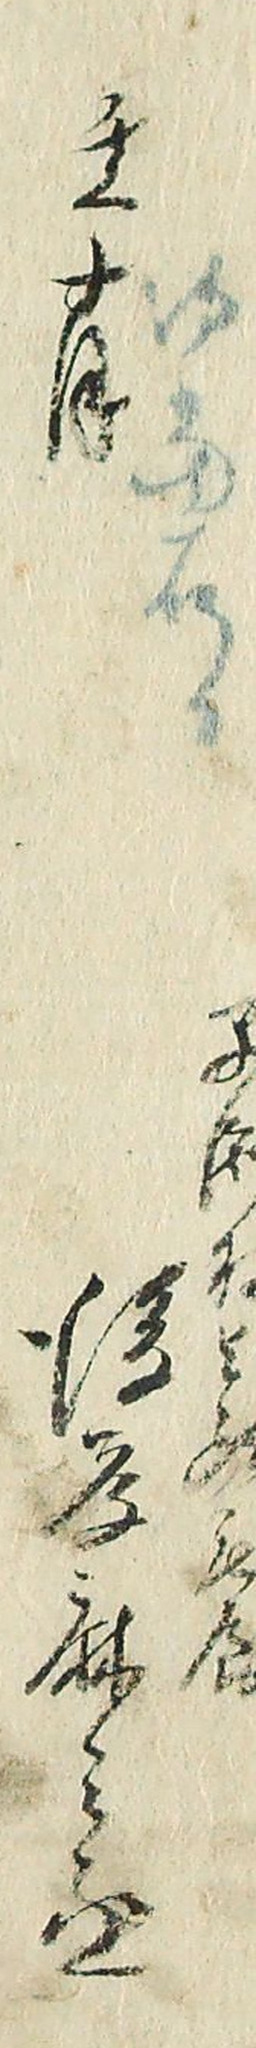亥十月後藤麻之丞
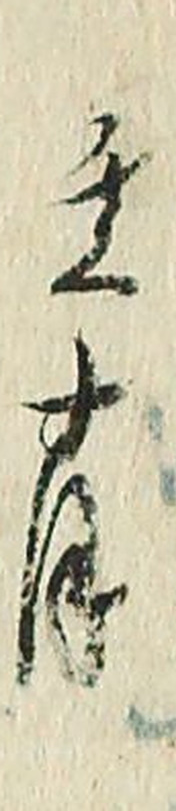亥十月
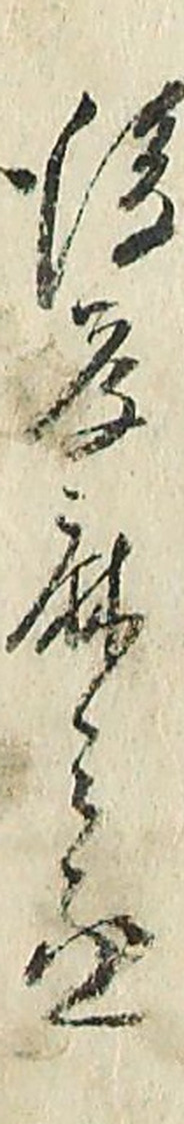後藤麻之丞
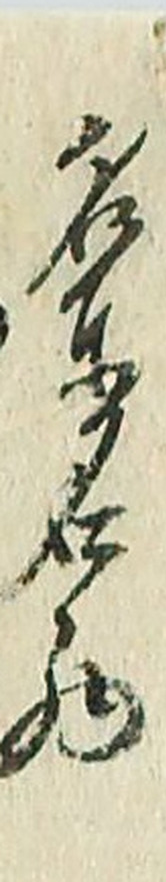名東名西
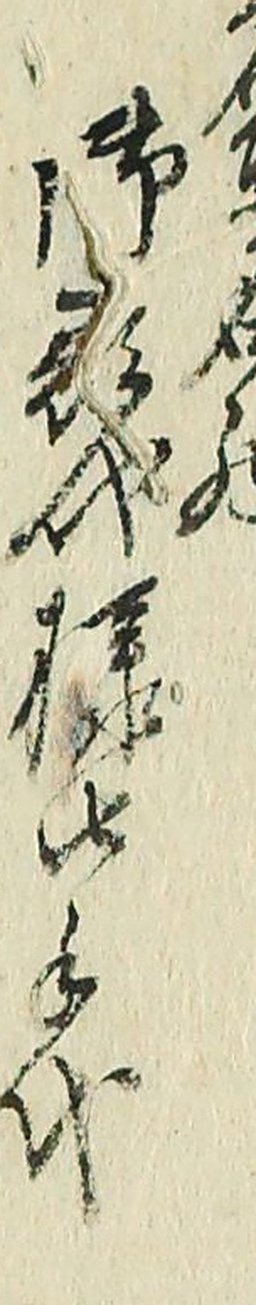御郡代様御手代
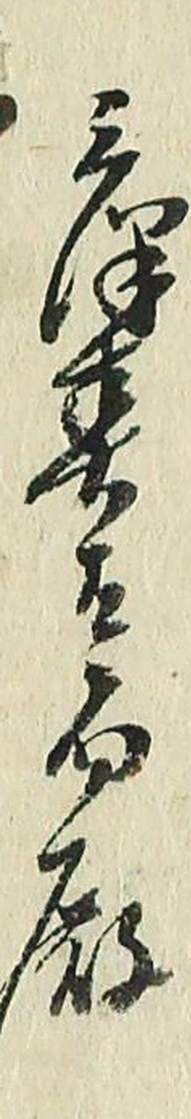三沢春太郎殿
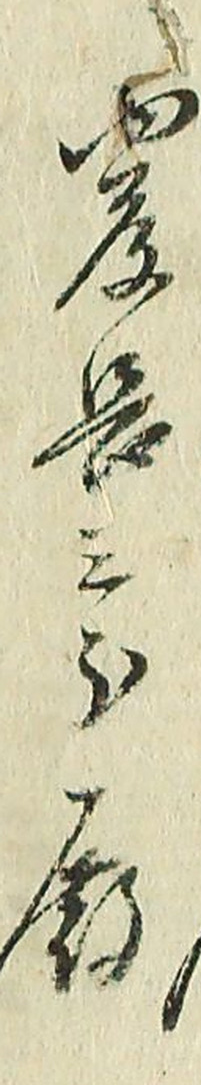内藤長三郎殿
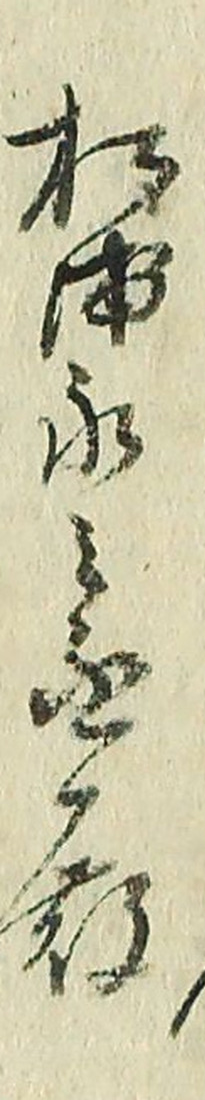松浦永之丞殿
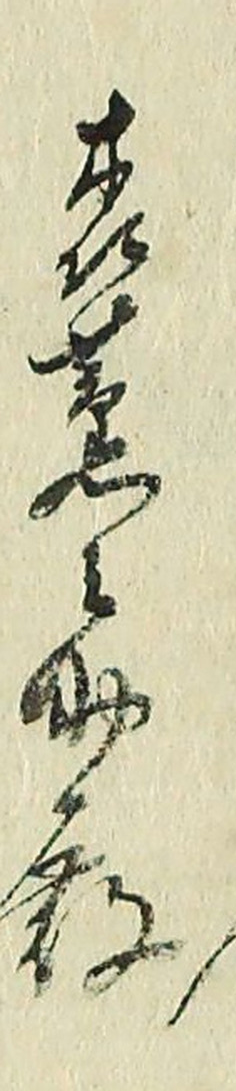森薫之助殿
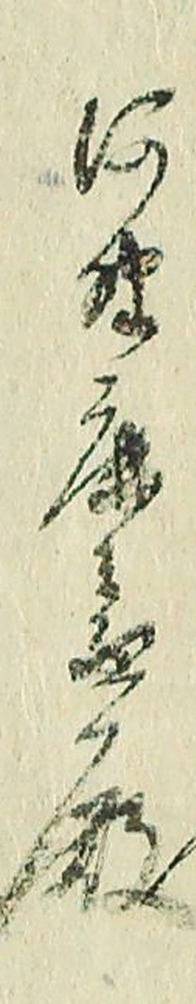河野鹿之丞殿
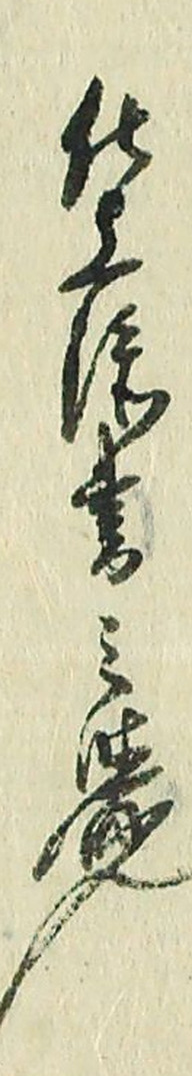仕上添書之覚
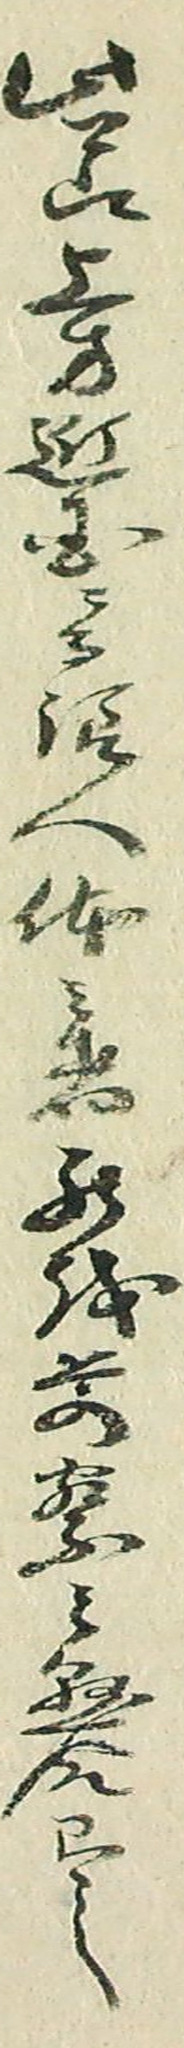此節上方近国に而浪人体之者罷越前察之懸合有之
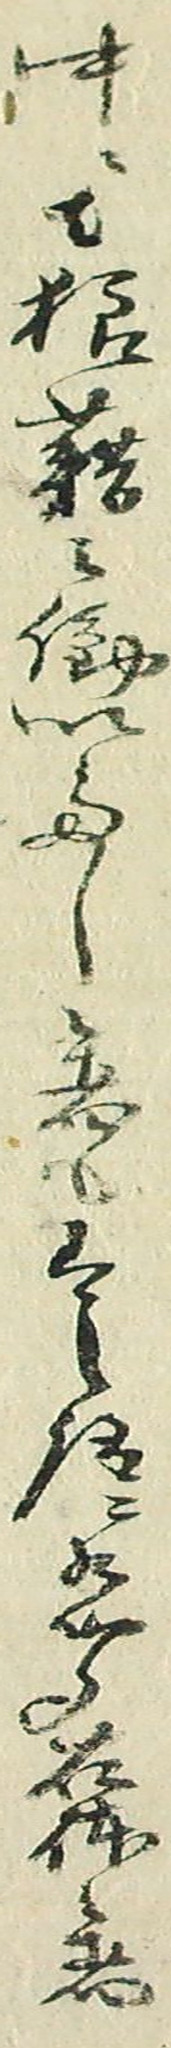中にも狼藉之働いたし候者も之有趣に相聞右体之者
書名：諸御用御□受書控
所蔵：鳴門教育大学 Naruto University of Education
